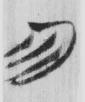勿
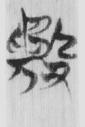{矛殳}
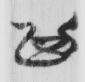𠀠
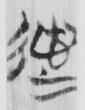{辶悤}
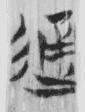通
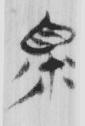眔
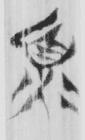寡
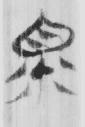眔
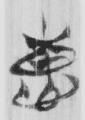惠
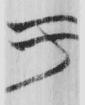于
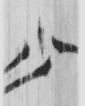少
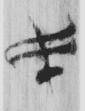民
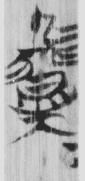{飛異}
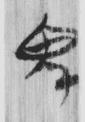鬼
